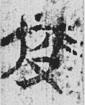便
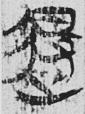○（嬖）
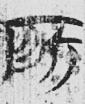所
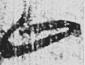㠯
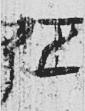○（距）
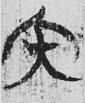内
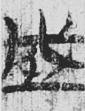城
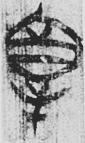○（郭）
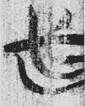必
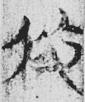攸（修）
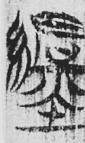○（繕）
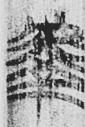○（甲）
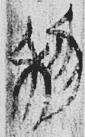利
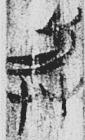兵
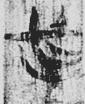必
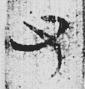又（有）
